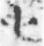屯
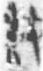○（紛）
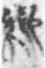綏
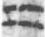二
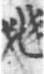○（戟）
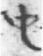屯
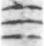三
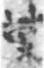菓（戈）
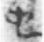屯
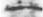一
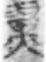翼
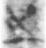之
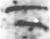二
